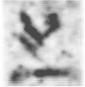之
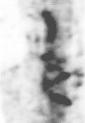屯
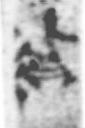紫
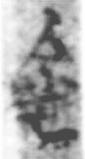○（錦）
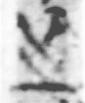之
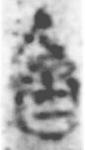裏
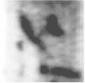之
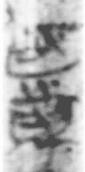○（緅）
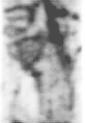敗
